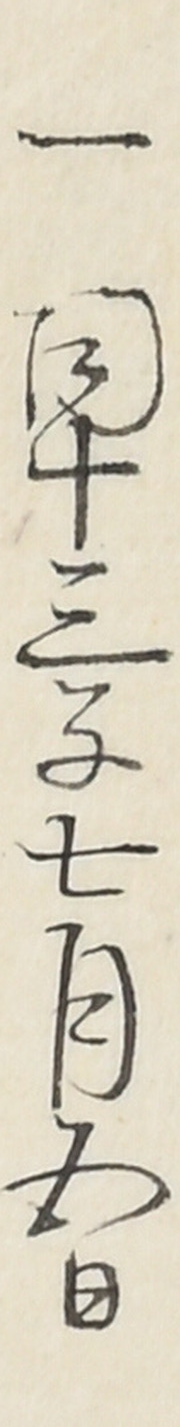一同十三子七月五日
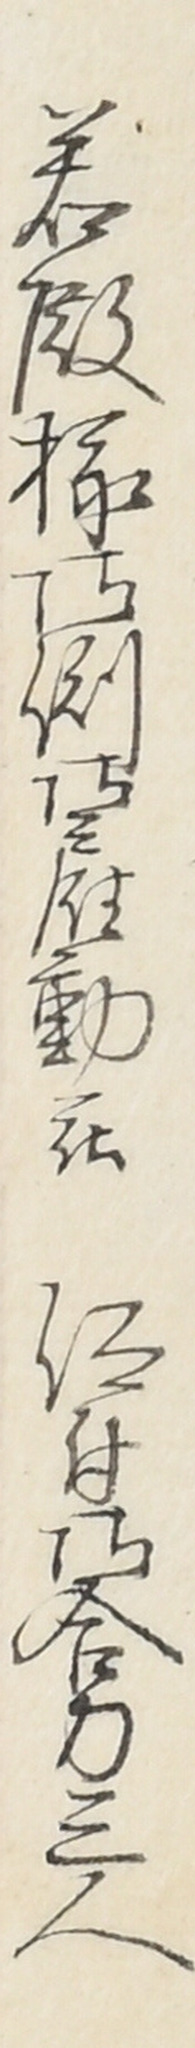若殿様御側御雇勤被仰付御合力三人

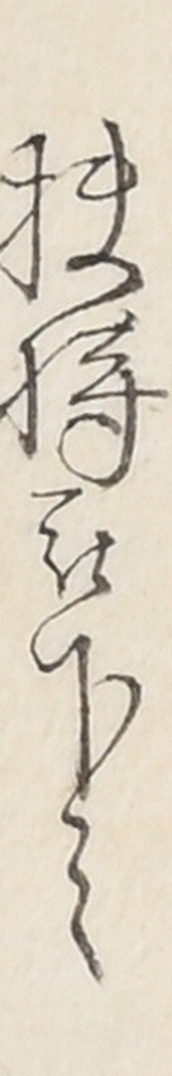扶持被下之
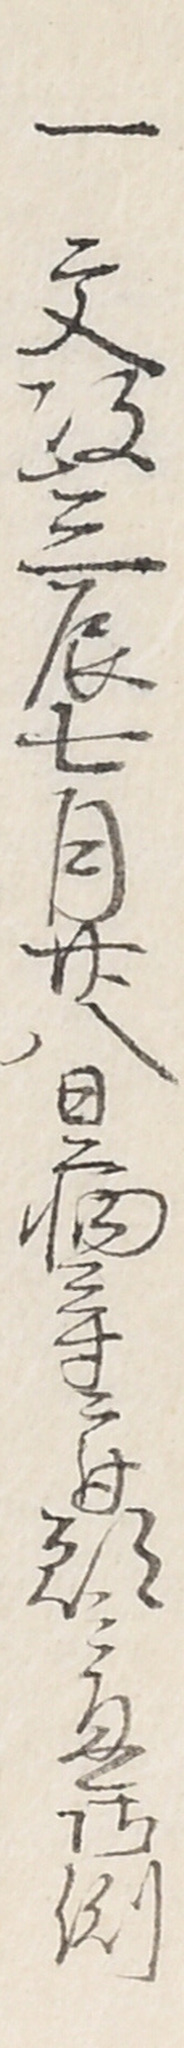一文政三辰七月廿八日病気ニ付願之通御側
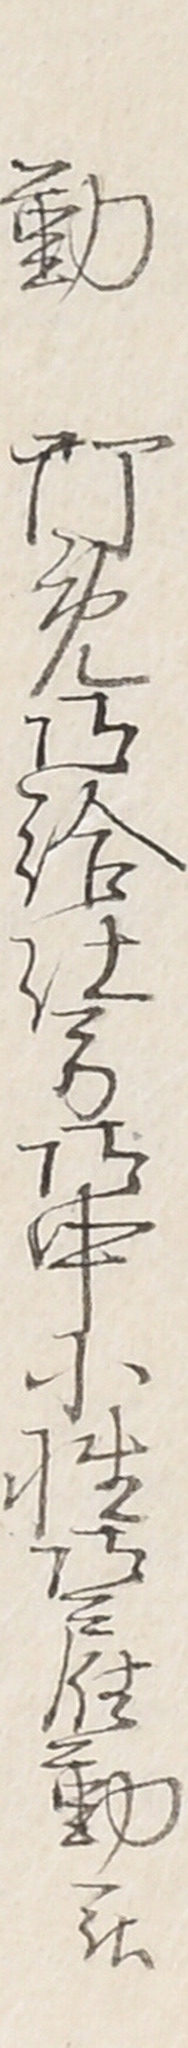勤御免給仕方御中小性御雇勤被
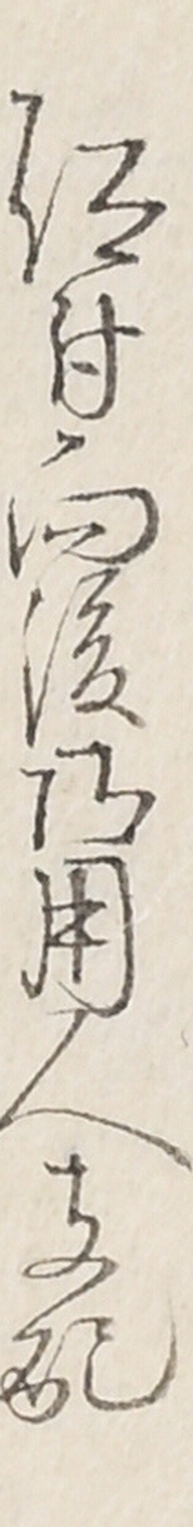仰付向後御用人支配
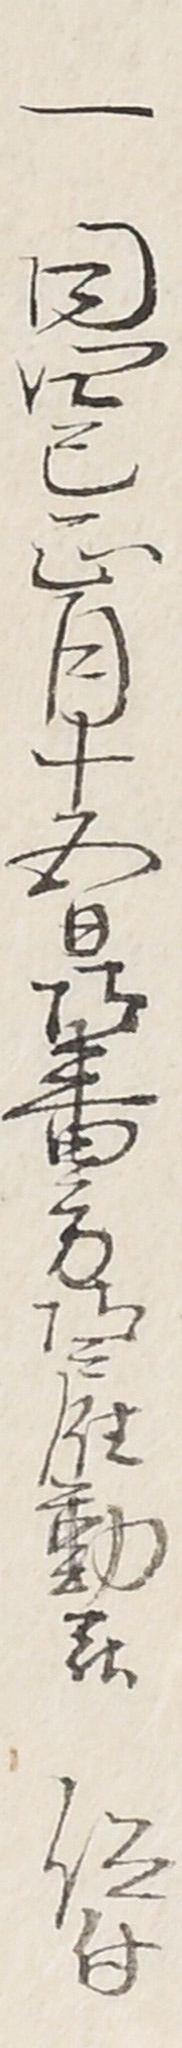一同四巳正月十五日御番方御雇勤被仰付
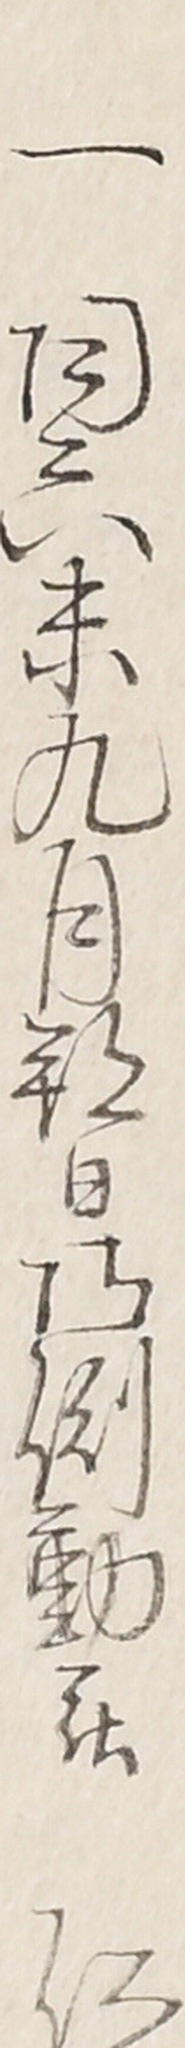一同六未九月朔日御側勤被仰付
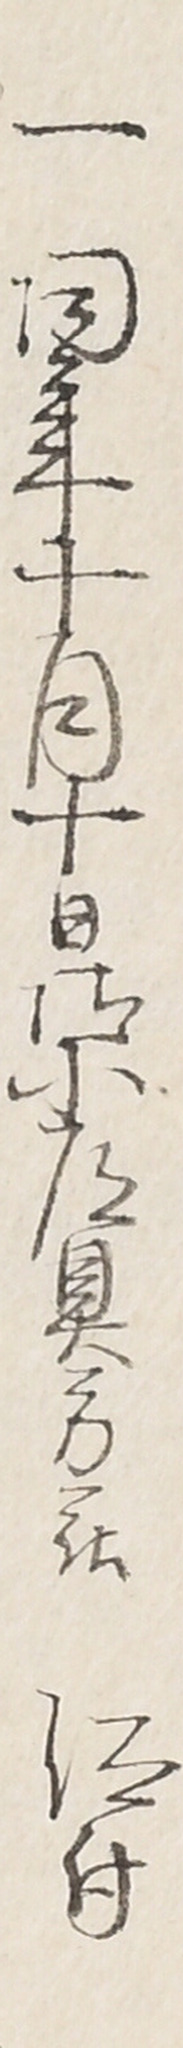一同年十月十日御小道具方被仰付
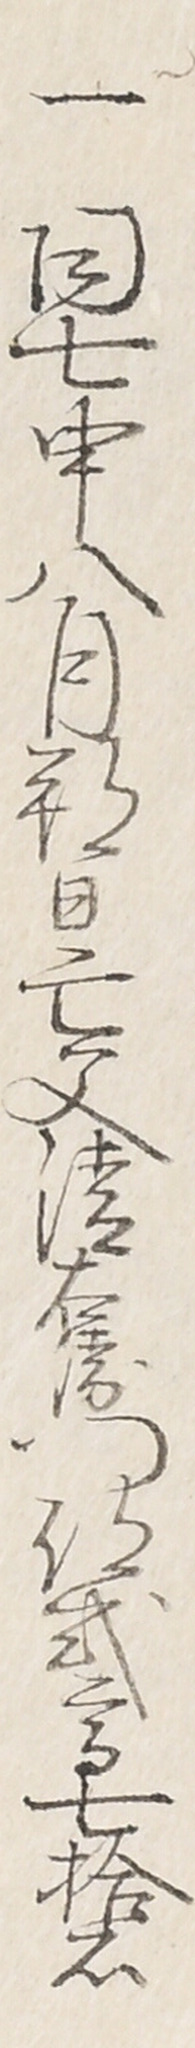一同七申八月朔日亡父清右衛門跡式高七拾石
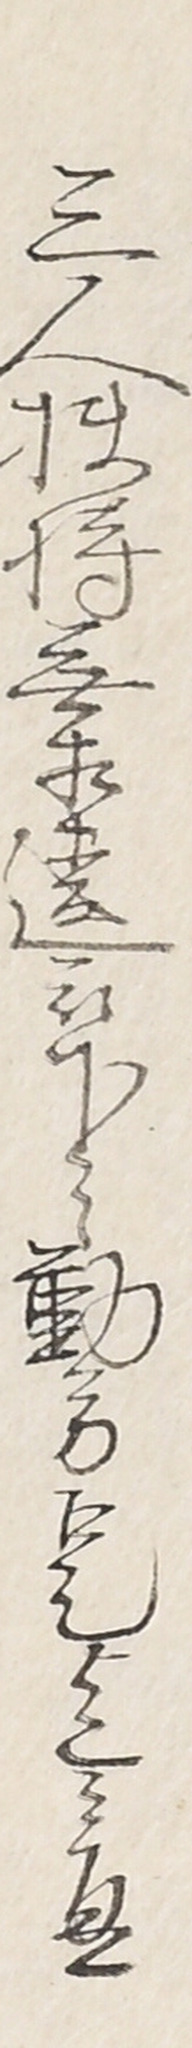三人扶持無相違被下之勤方是迄之通
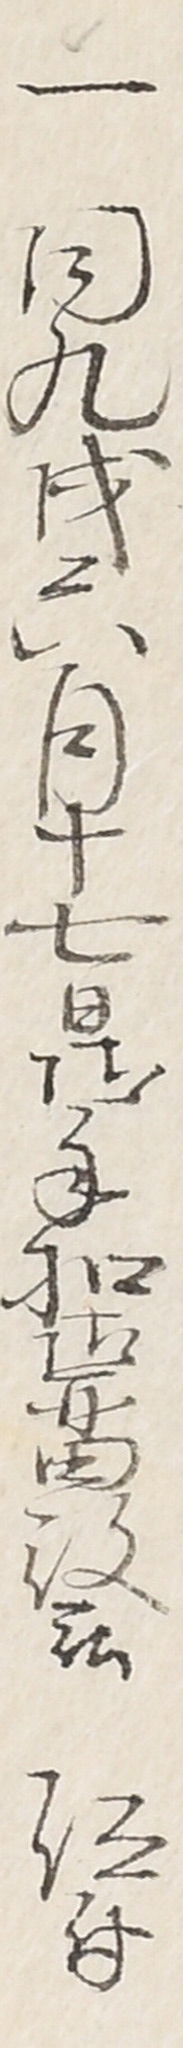一同九戌六月十七日御手控御留役被仰付
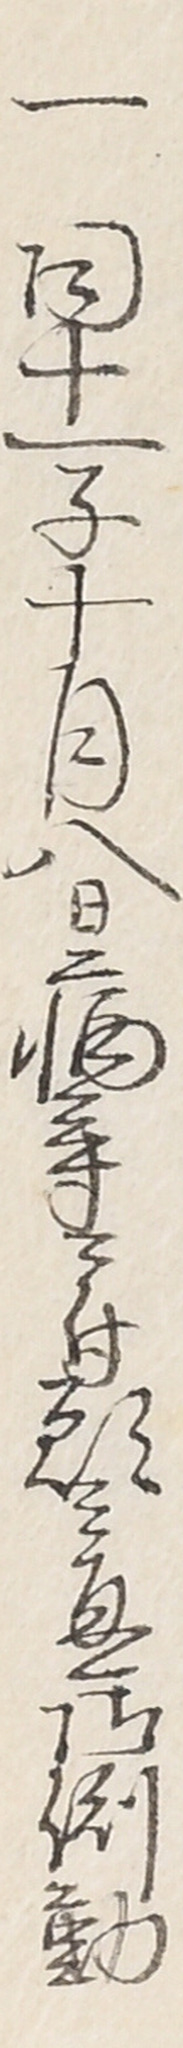一同十一子十月八日病気ニ付願之通御側勤
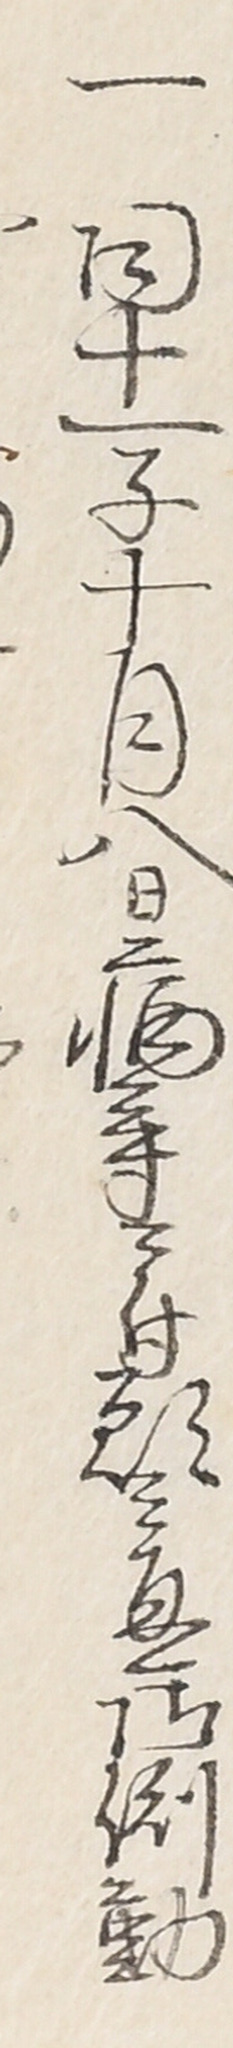一同十一子十月八日病気ニ付願之通御側勤
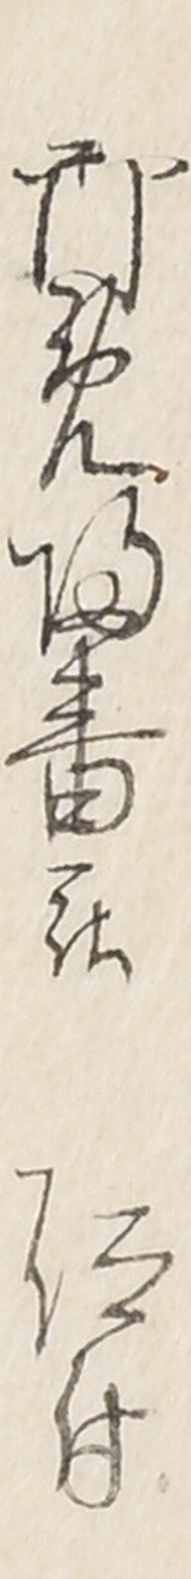御免帰番被仰付
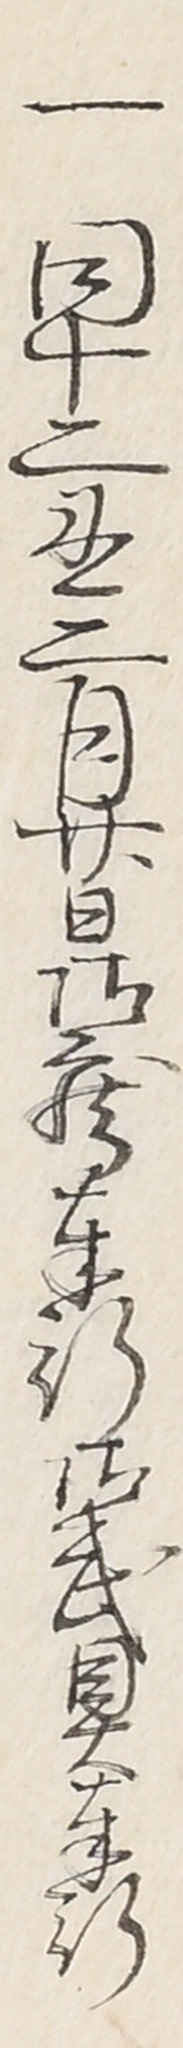一同十二丑三月廿日御蔵奉行御武具奉行
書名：給人諸士勤仕録（七）
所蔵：伊那市立高遠町図書館・合同会社AMANE
